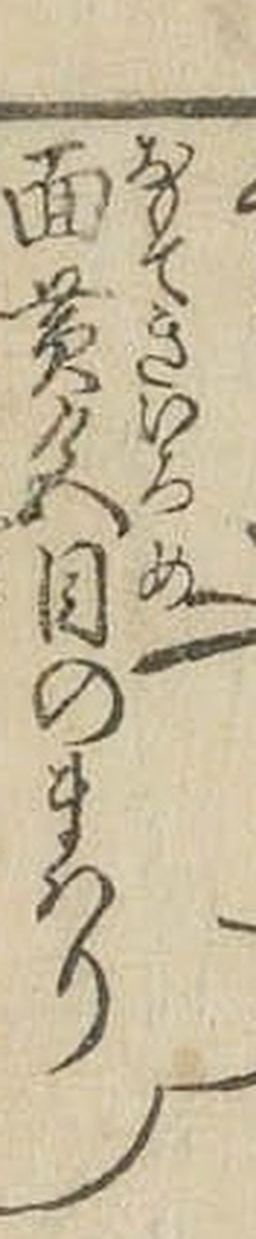面黄色目のまはり
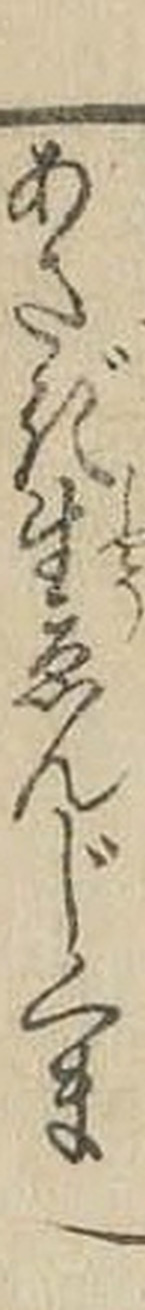あさぎ生ゑんじくま
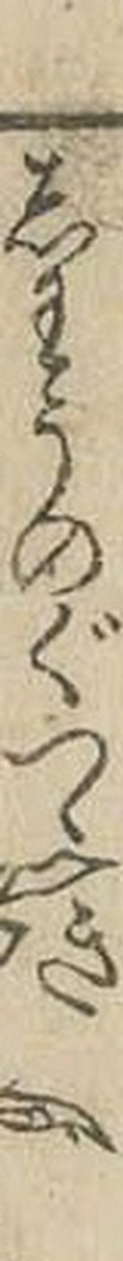しわうのぐつゝき
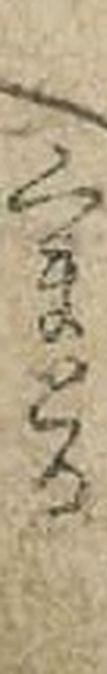くまとる
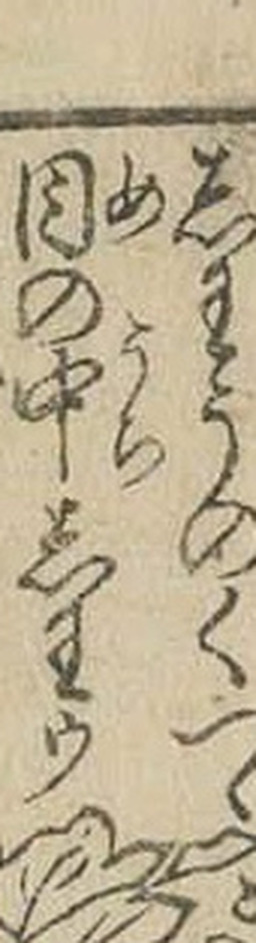目の中しわう
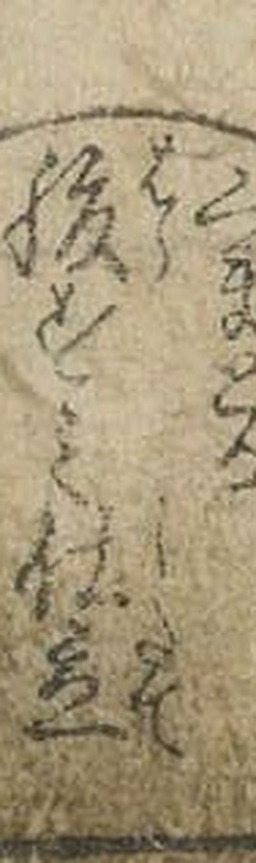腹すみ仕立
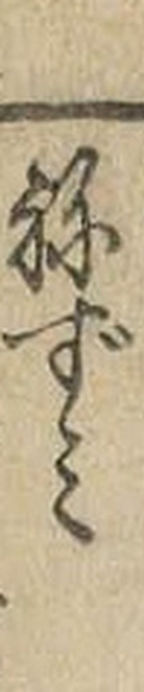ねずみ
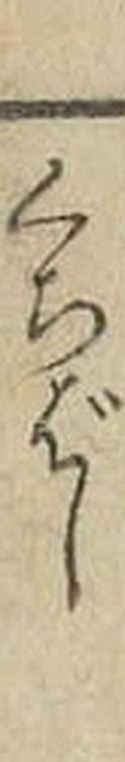くちばし
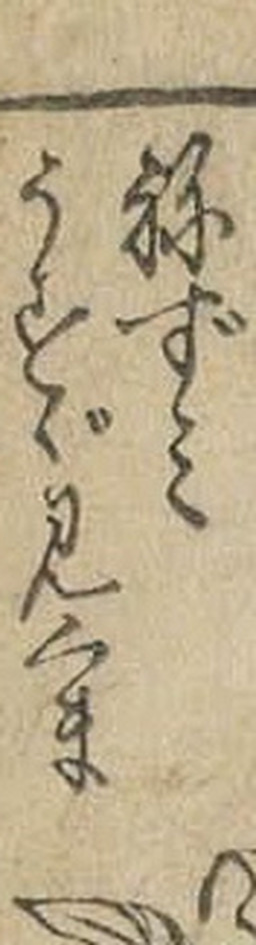うすゞみくま
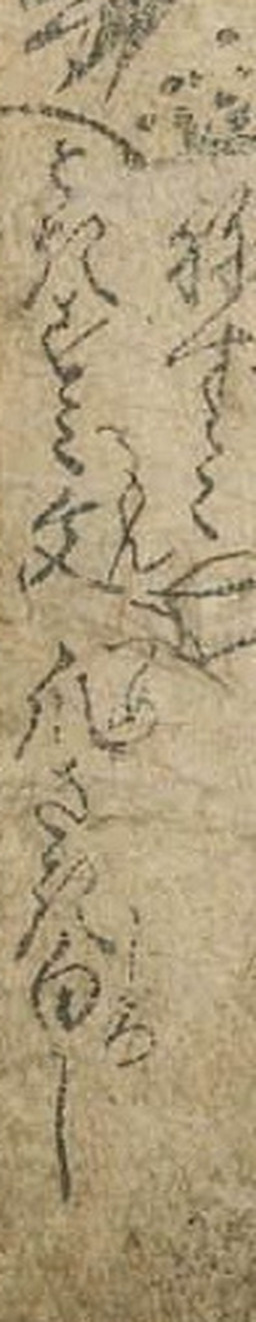ときすみ文爪さき白し

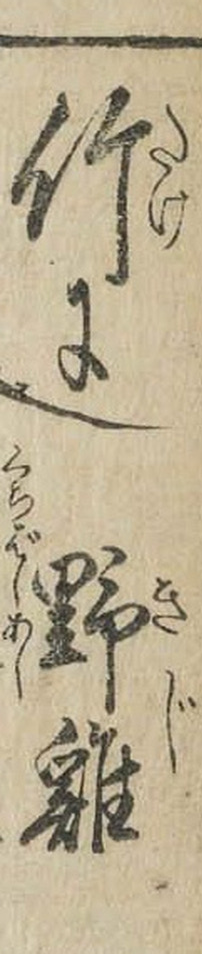竹に野雞
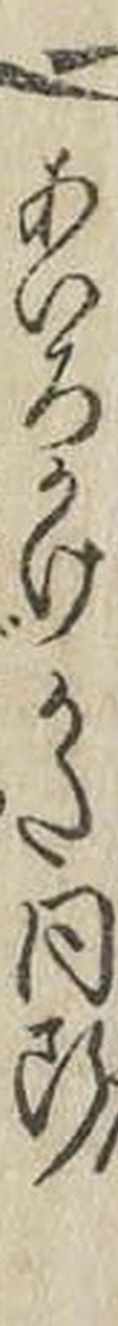あいろかけかた同断
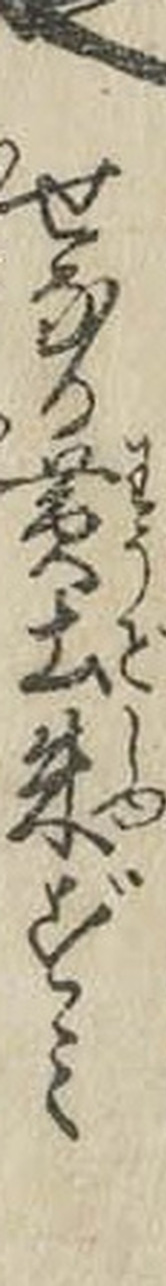せなか黄土朱ずみ
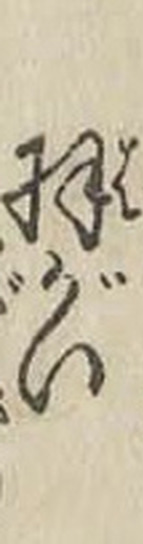羽がい
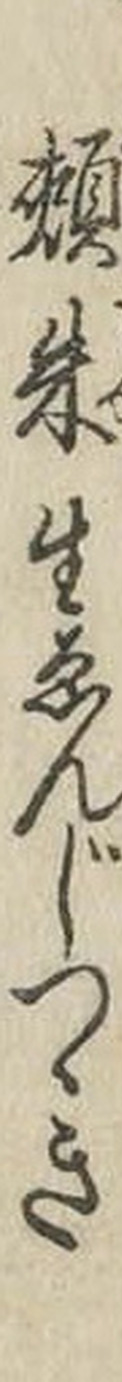頬朱生ゑんじつゝき
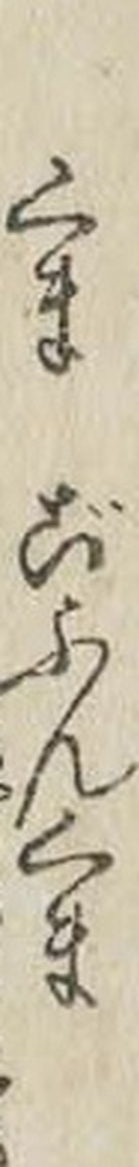くまごふんくま
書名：絵本写宝袋 9巻 8之巻
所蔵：東京学芸大学教育コンテンツアーカイブ
